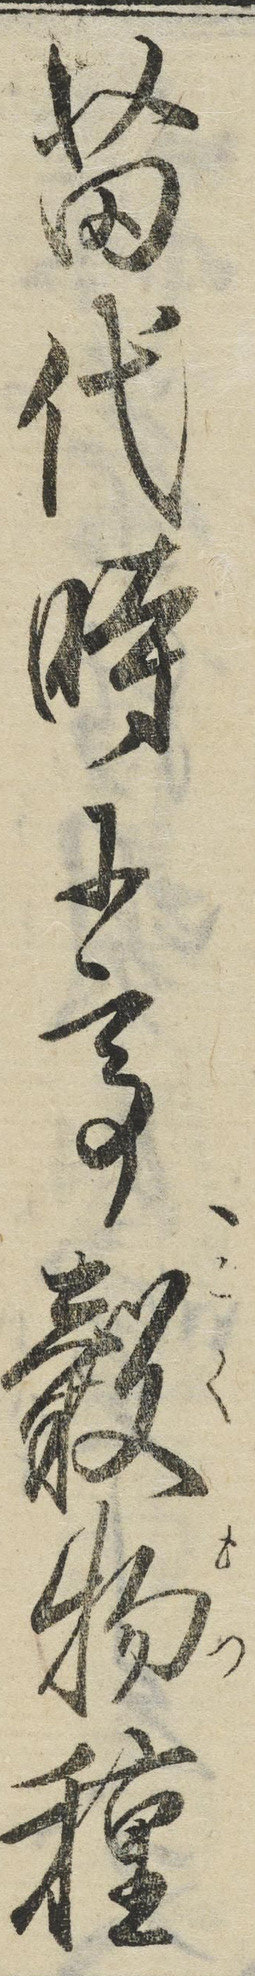苗代時にて、穀物種
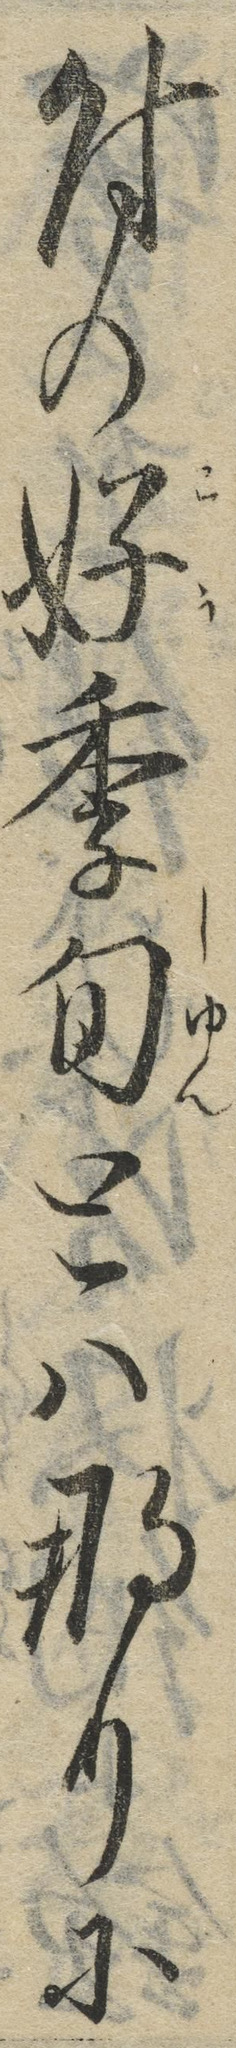付の好季旬とはなりに
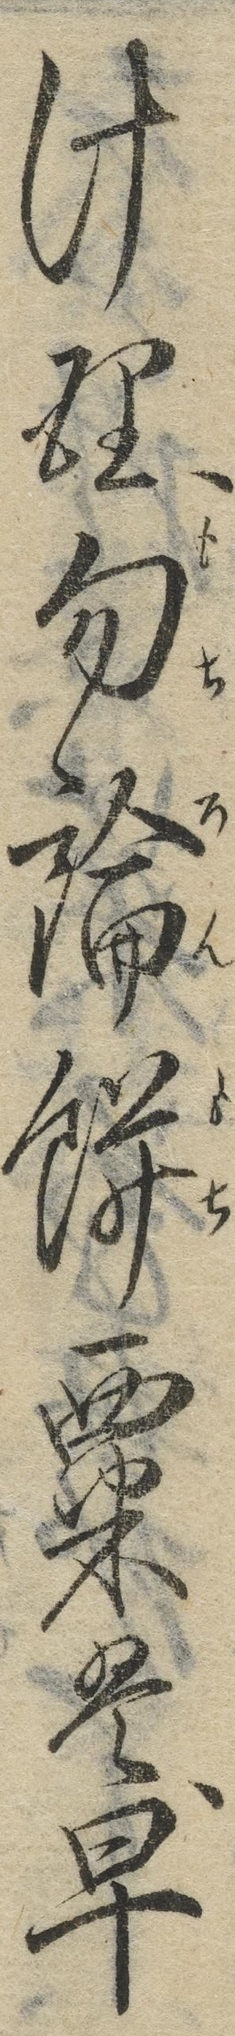けり、勿論餅粟は、早
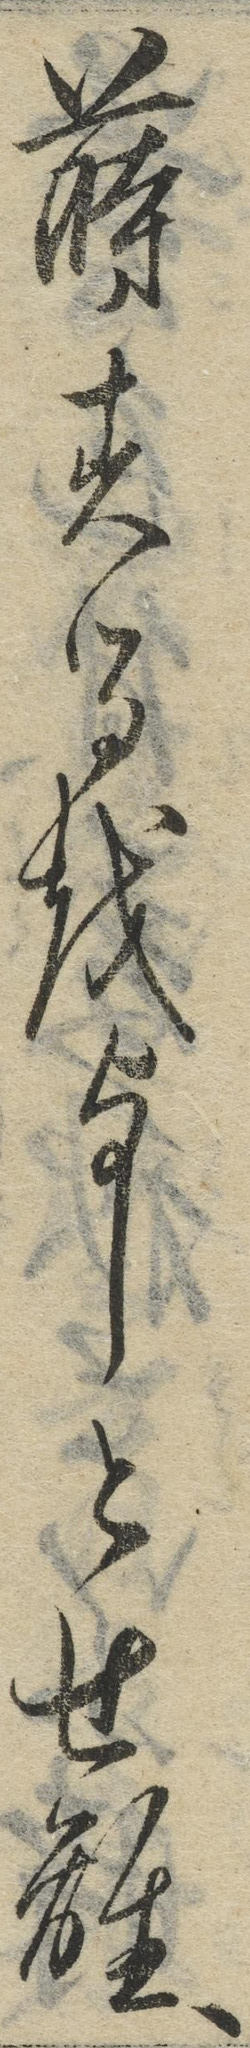蒔するをよしとせり、
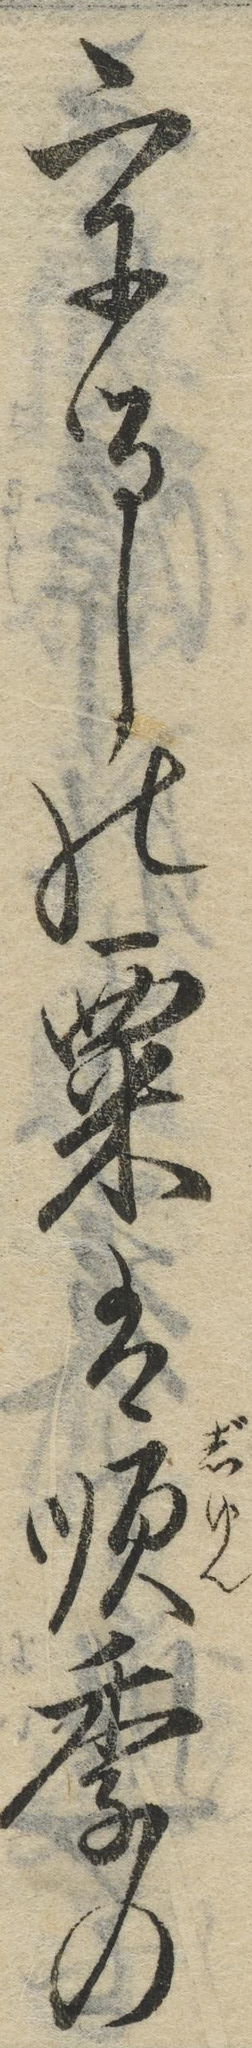うるしの粟は順季の
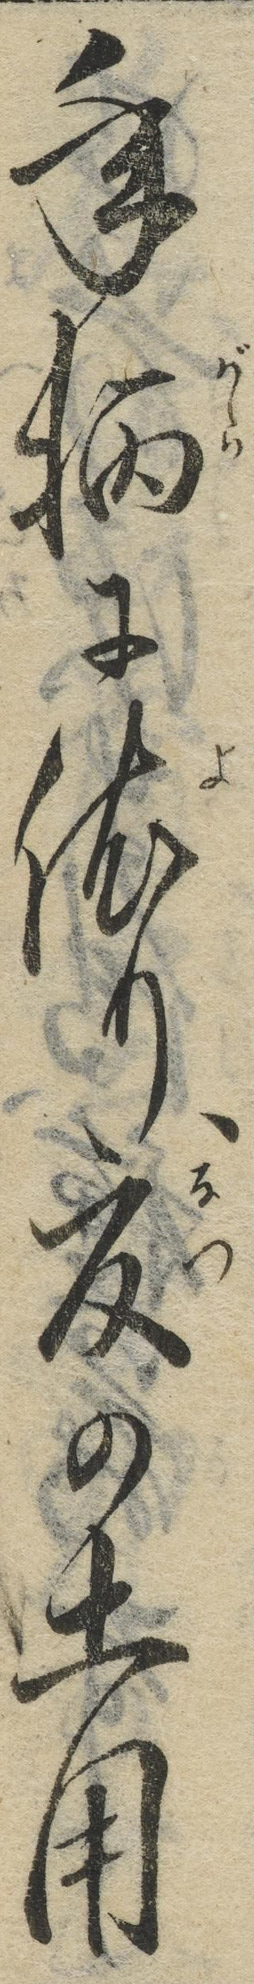年柄に依り、夏の土用

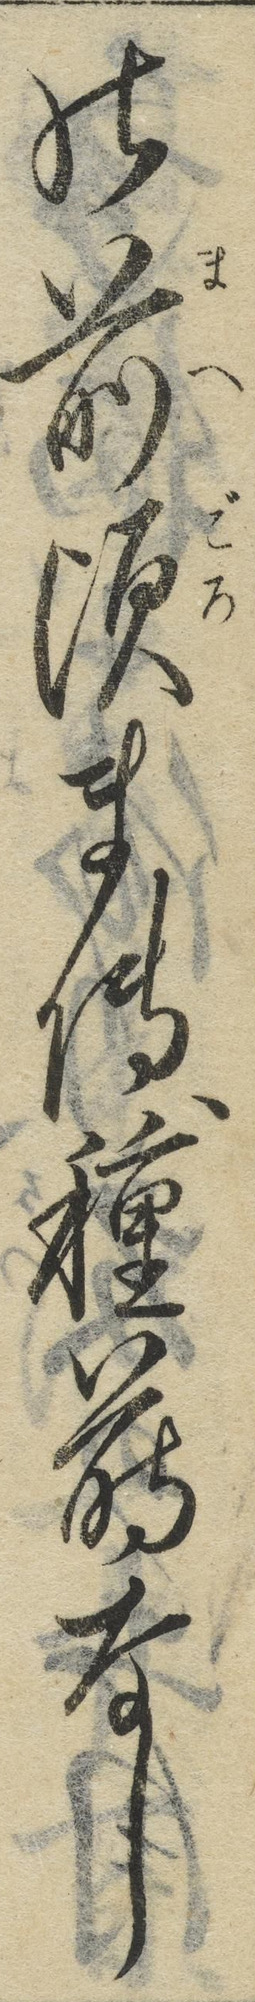の前頃まて、種蒔なし
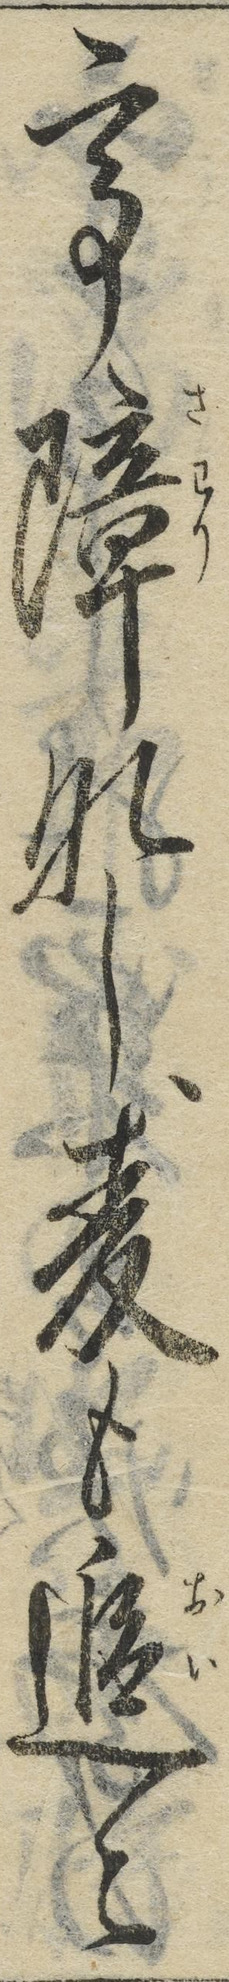て障なし、麦も追々
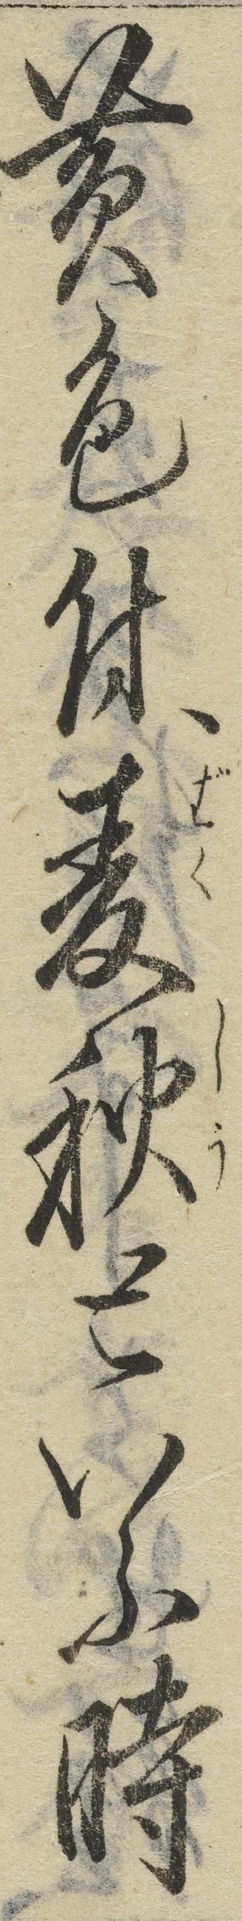黄色付、麦秋といふ時
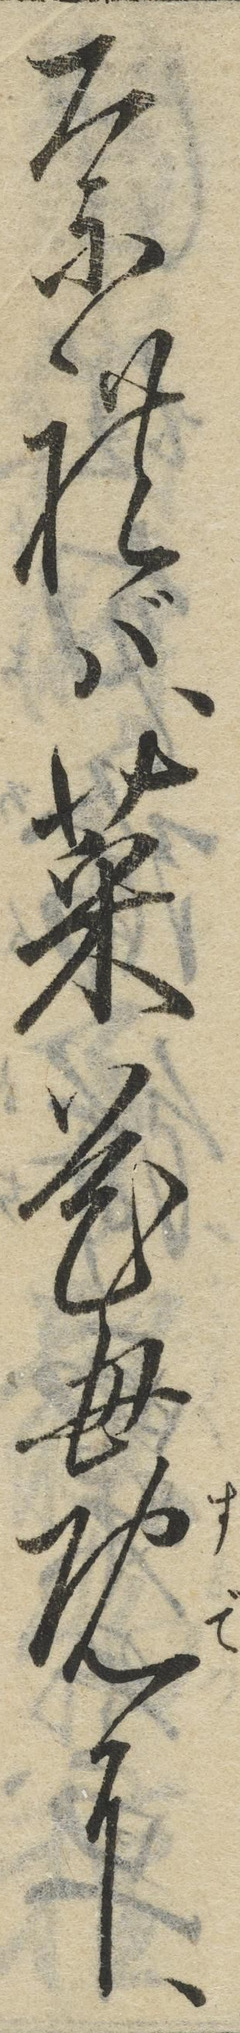なれば、菜花も既に、
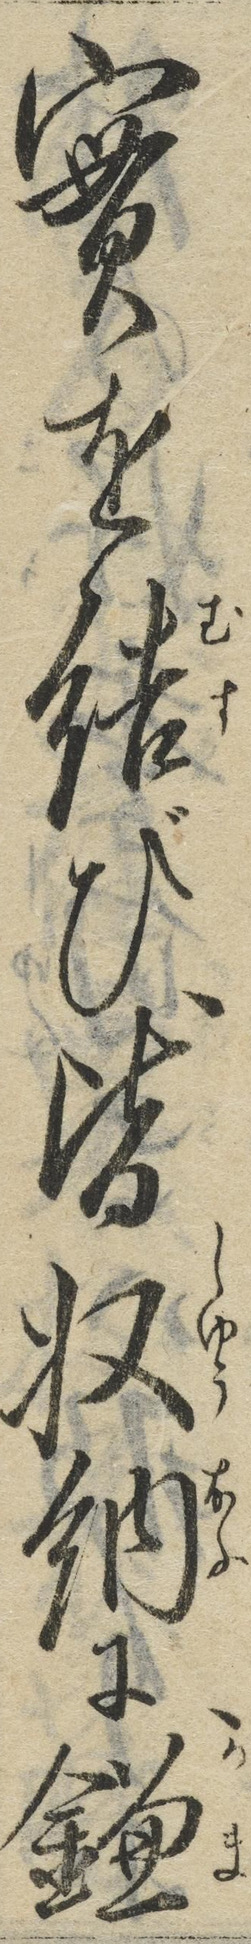実を結び、皆収納に、鎌
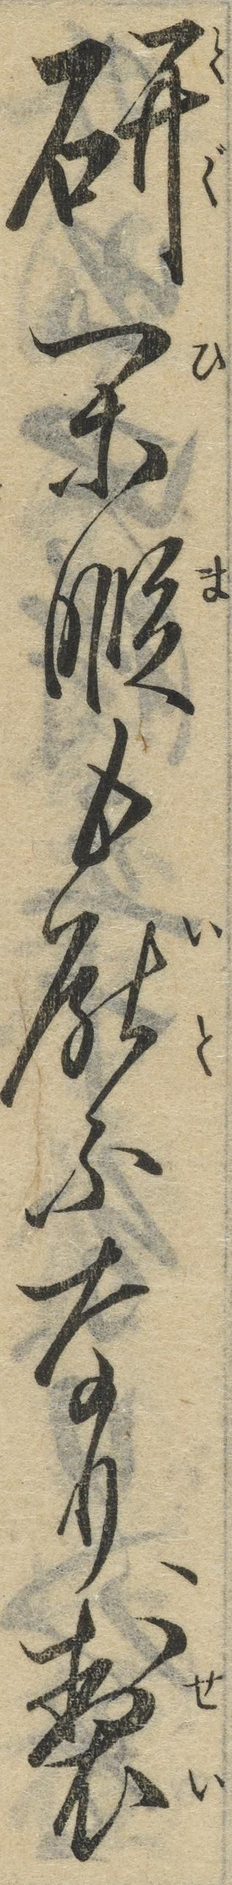研閑暇も厭ふなり、製
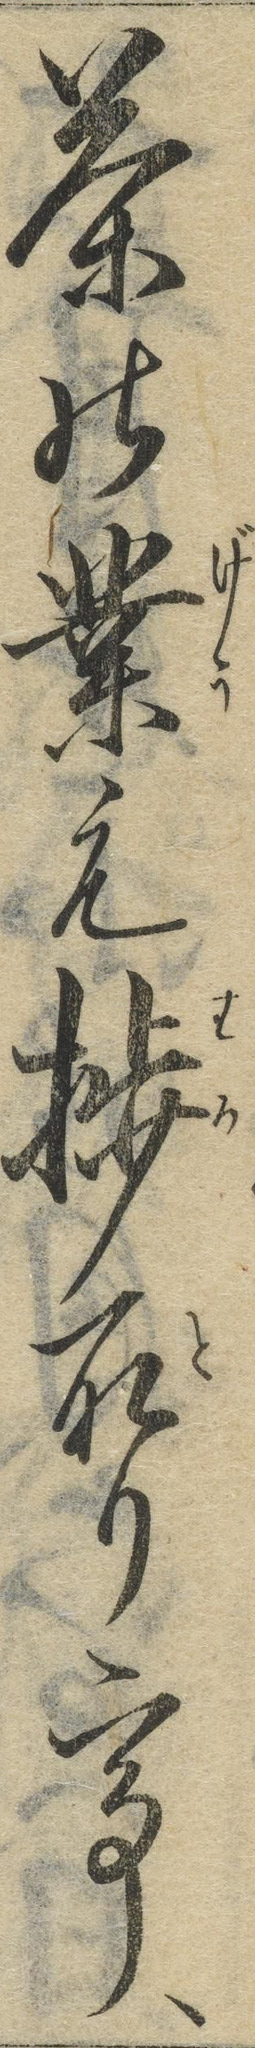茶の業は捗取りて、
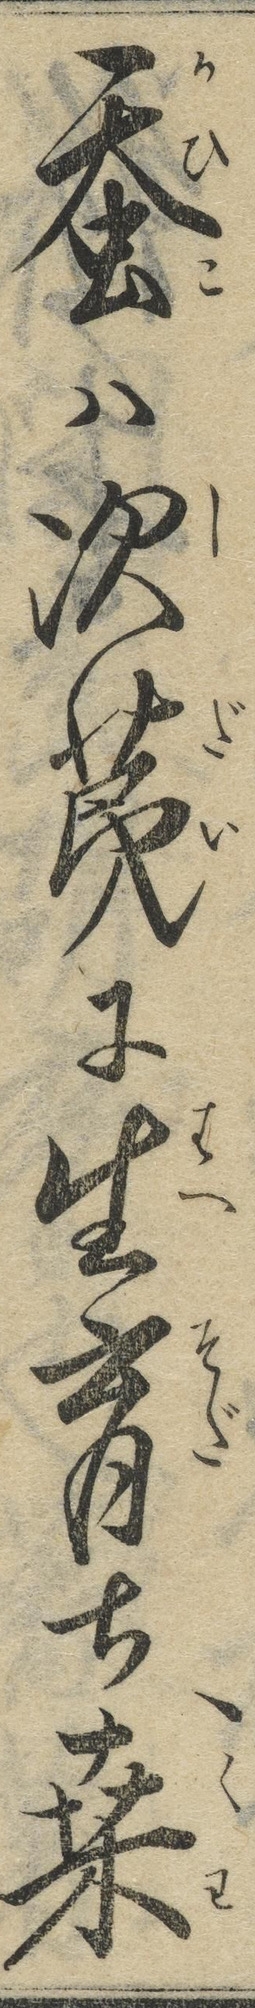蚕は次第に生育ち、桑
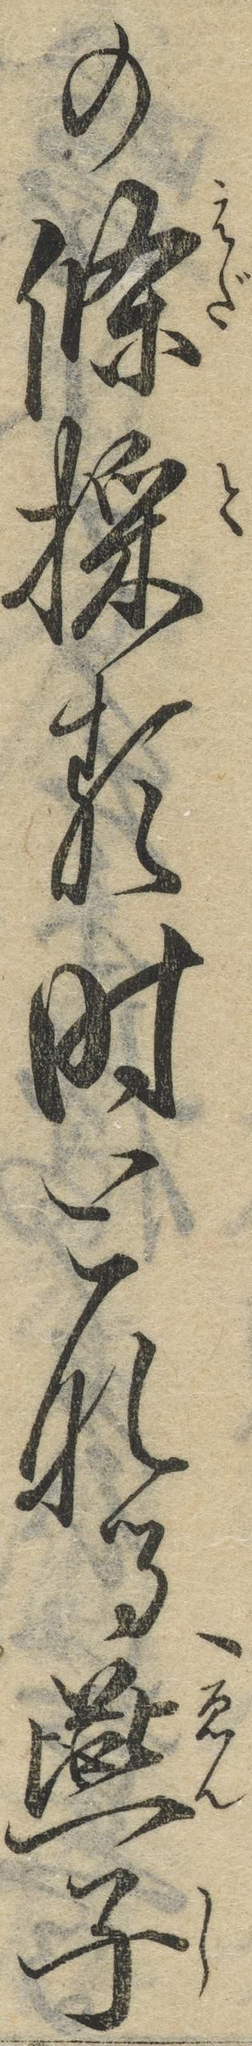の條採る時となる、燕子
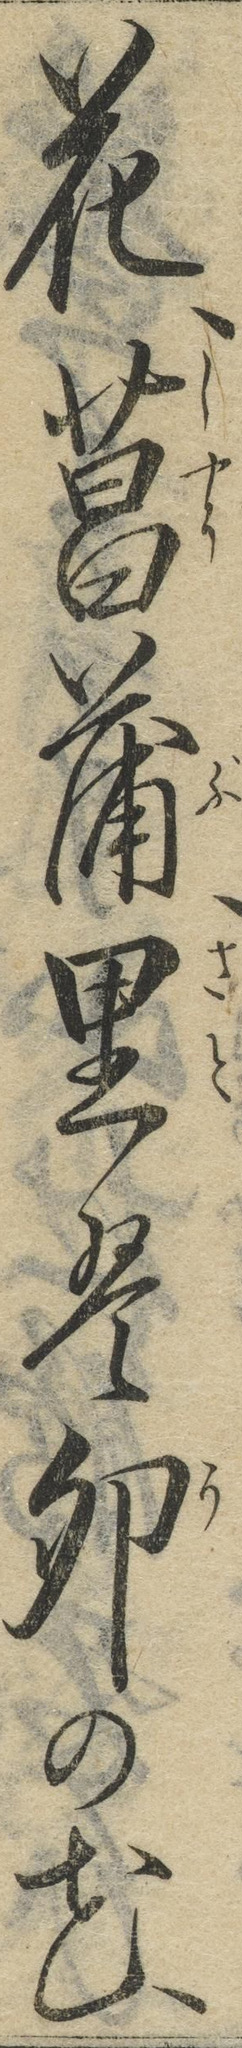花、菖蒲、里は卯の花、
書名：暦日往来　單
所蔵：東京大学地震研究所図書室 Earthquake Research Institute Library, The University of Tokyo, JAPAN
